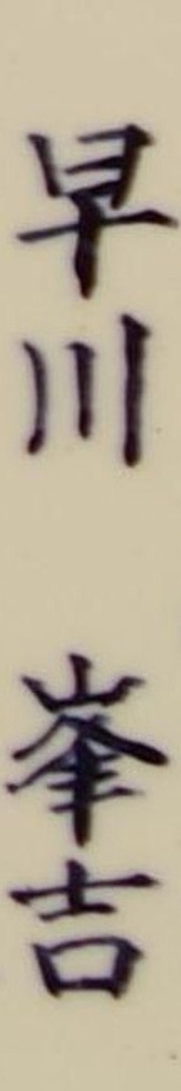早川峯吉
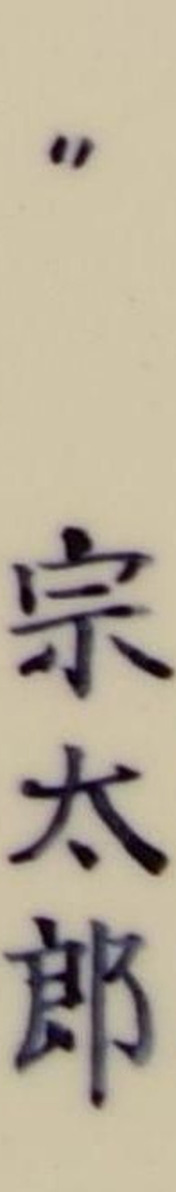宗太郎
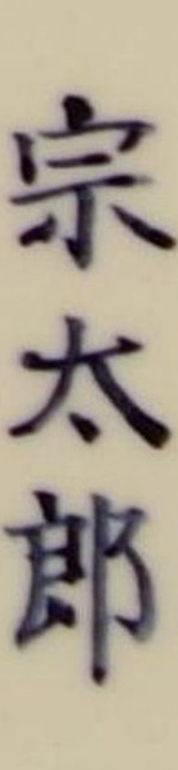宗太郎
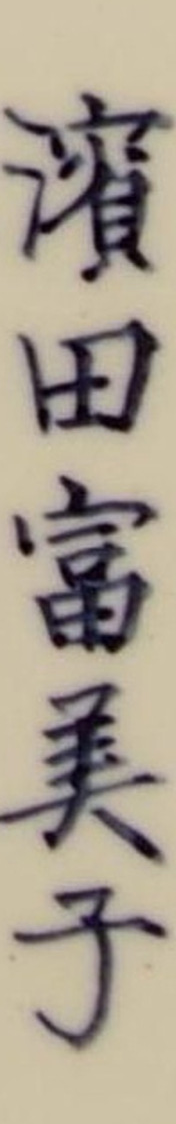濱田富美子
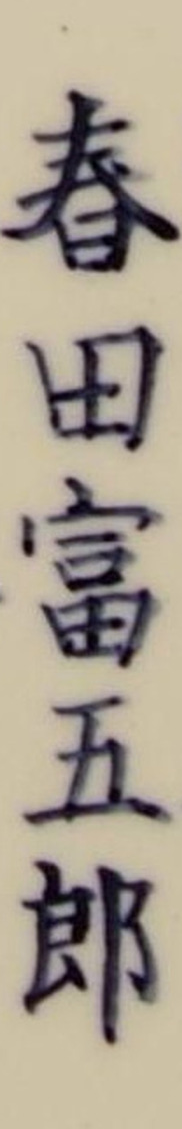春田富五郎
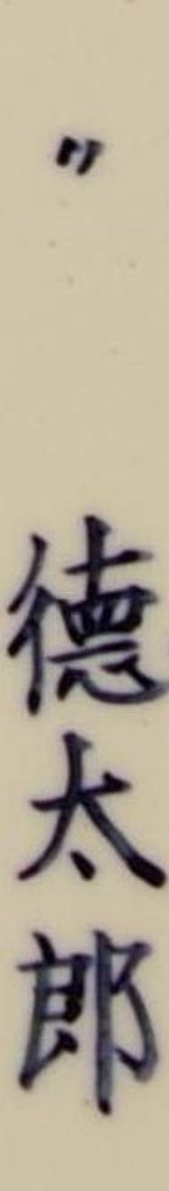徳太郎
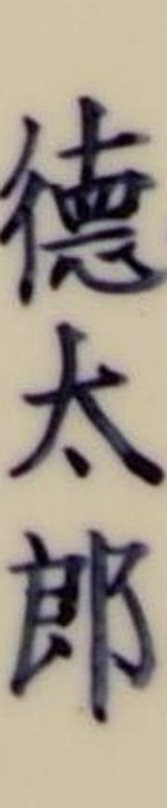徳太郎
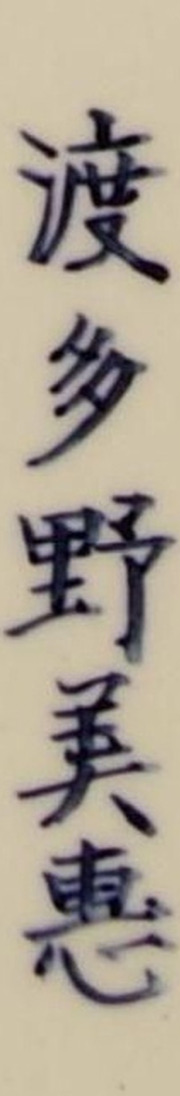渡多野美恵
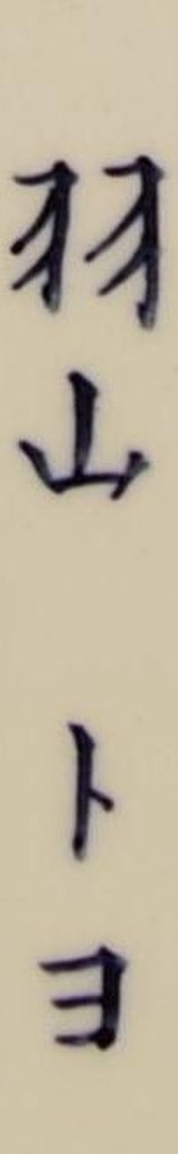羽山トヨ
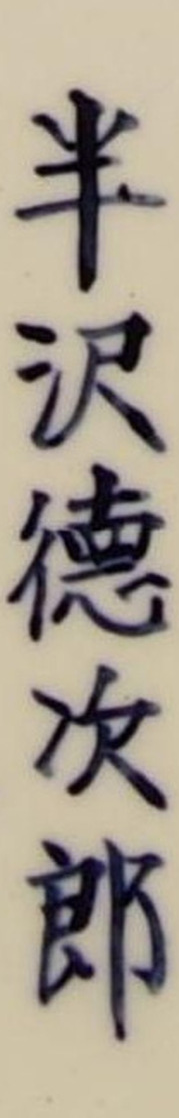半沢徳次郎
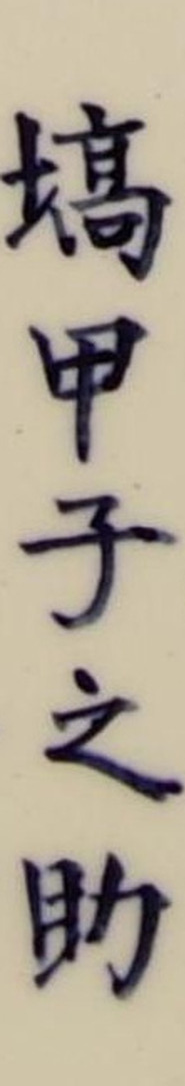塙甲子之助
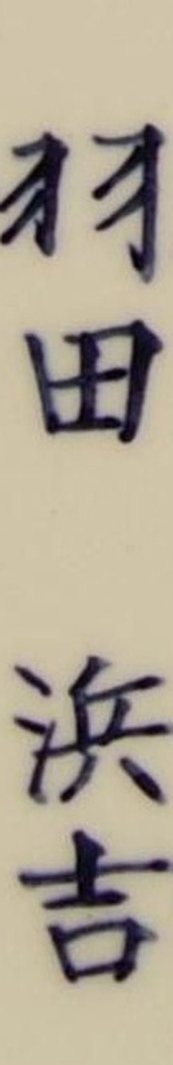羽田浜吉
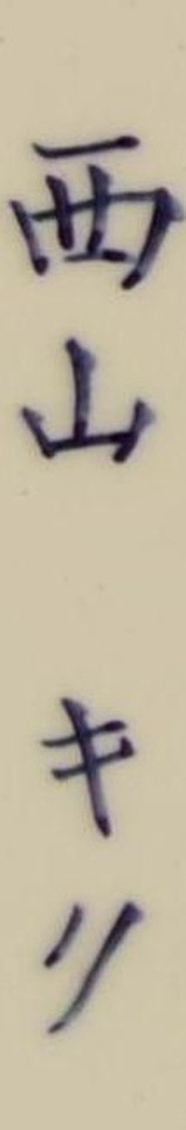西山キク
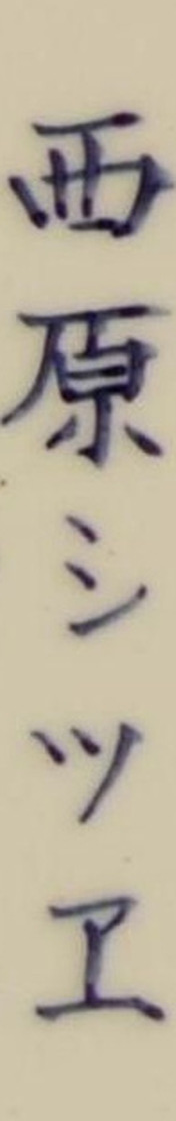西原シツエ
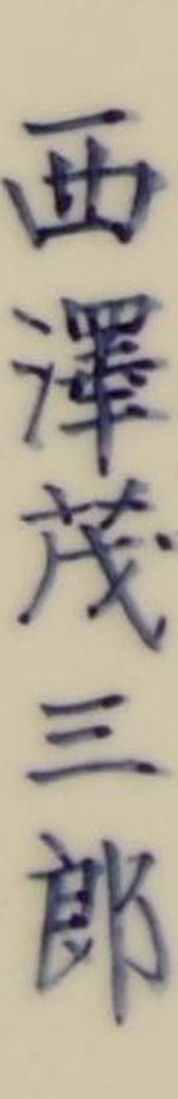西澤茂三郎
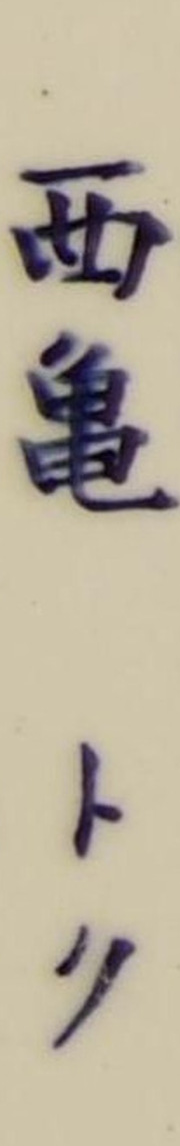西亀トク
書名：E~L
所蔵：高野山金剛峯寺
